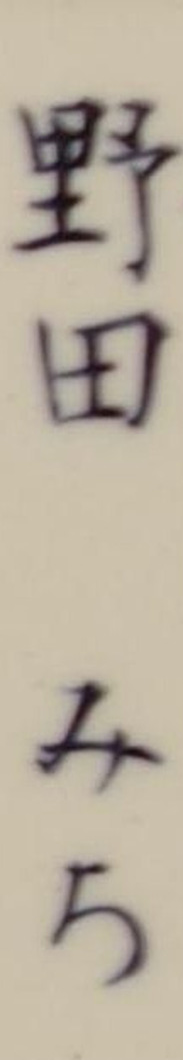野田みち
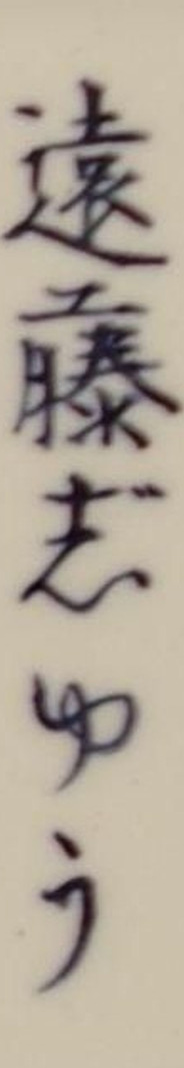遠藤じゆう
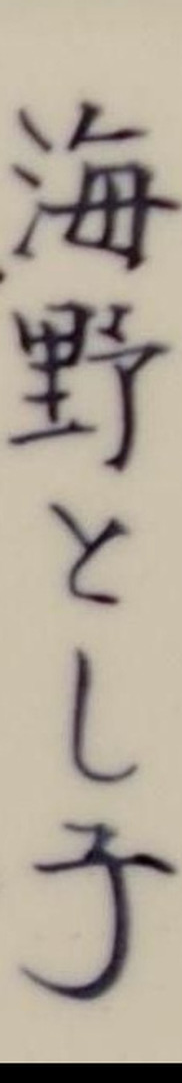海野とし子
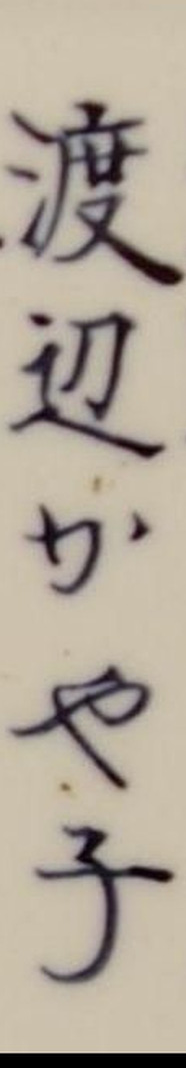渡辺かや子
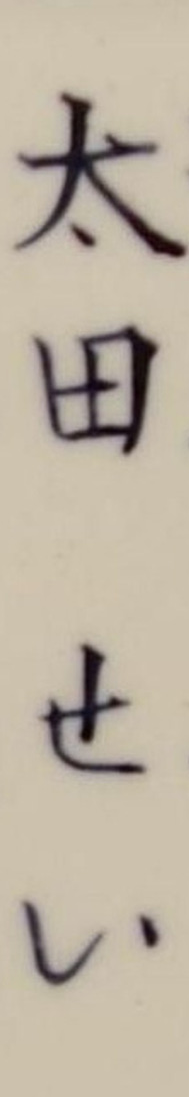太田せい
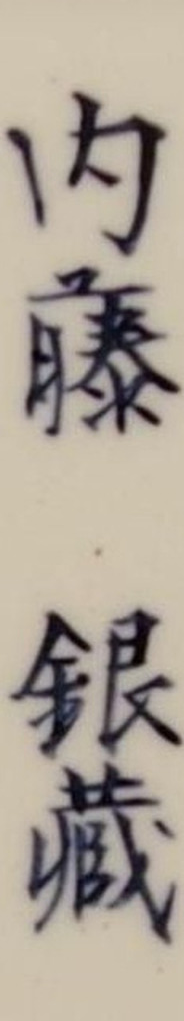内藤銀蔵
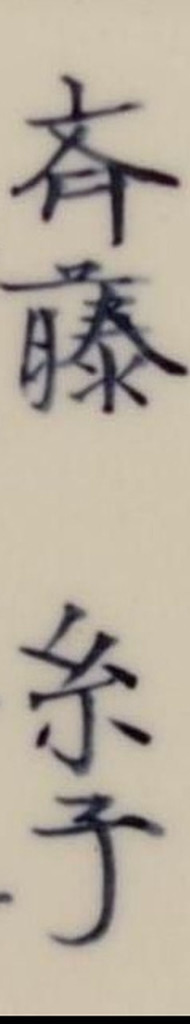斉藤糸子
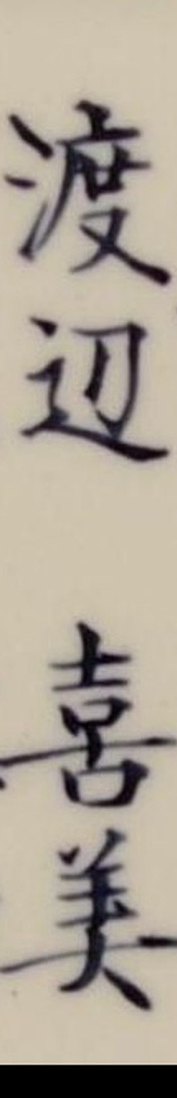渡辺喜美
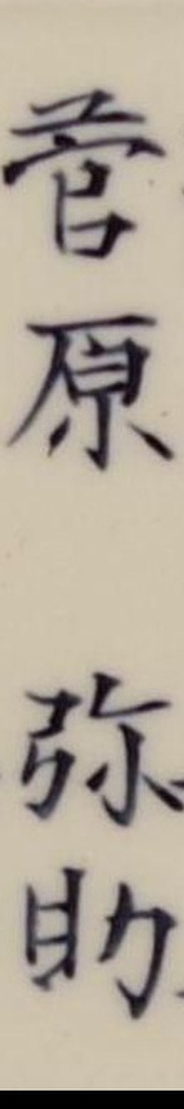菅原弥助
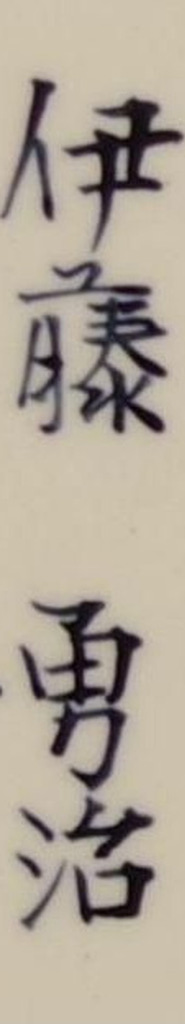伊藤勇治
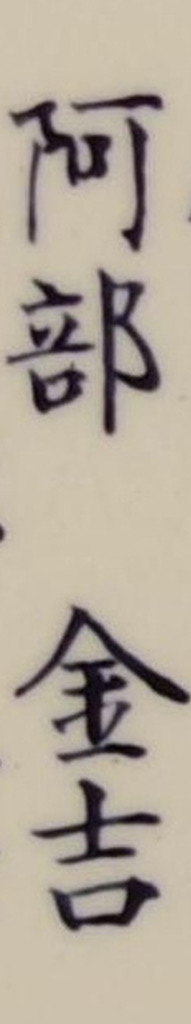阿部金吉
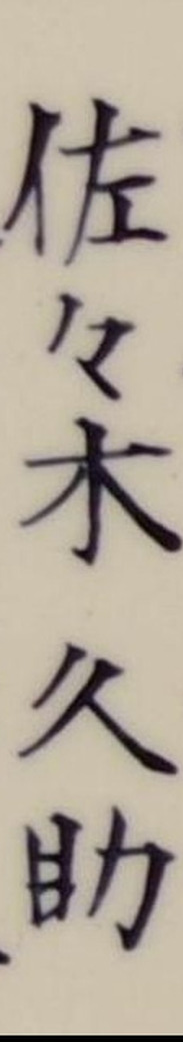佐々木久助
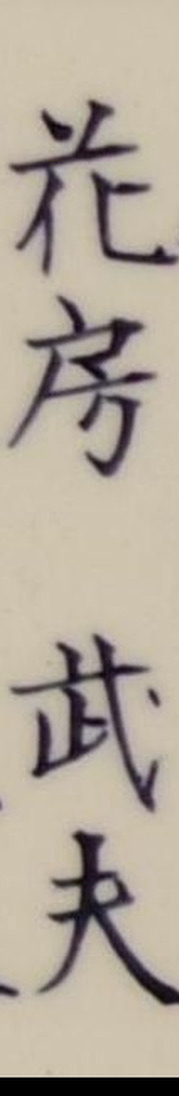花房武夫
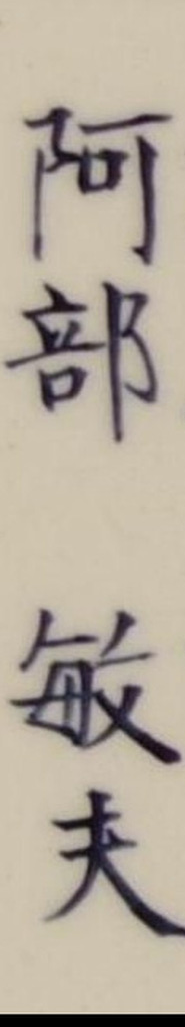阿部敏夫
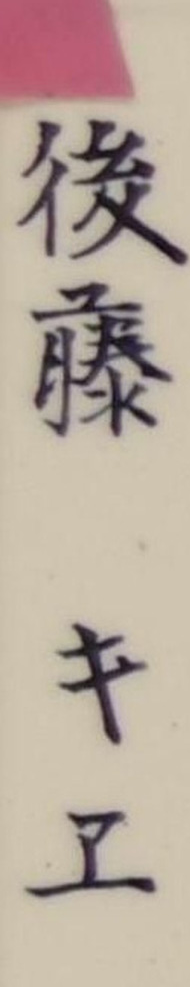後藤キヱ

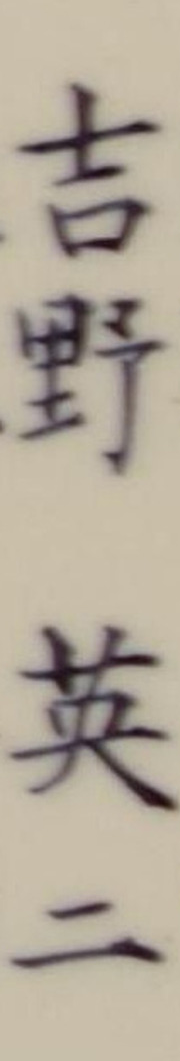吉野英二
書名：M~S
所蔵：高野山金剛峯寺
